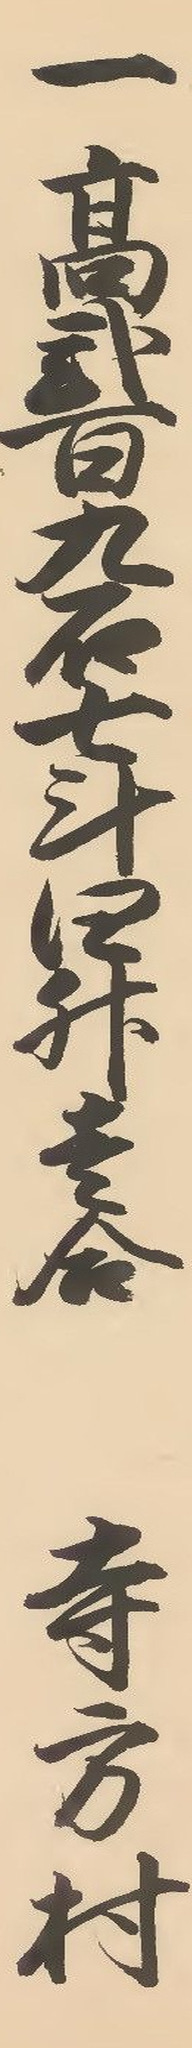一高弐百九石七斗四升壱合寺方村
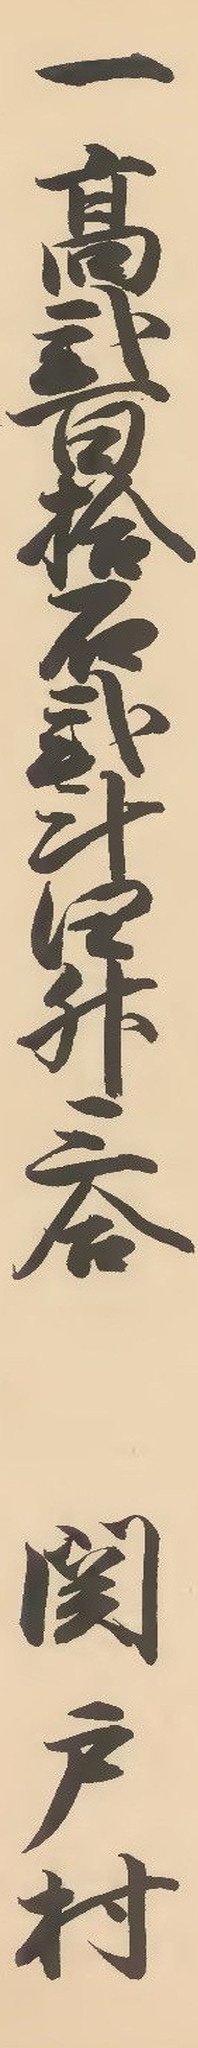一高弐百拾石弐斗四升三合関戸村
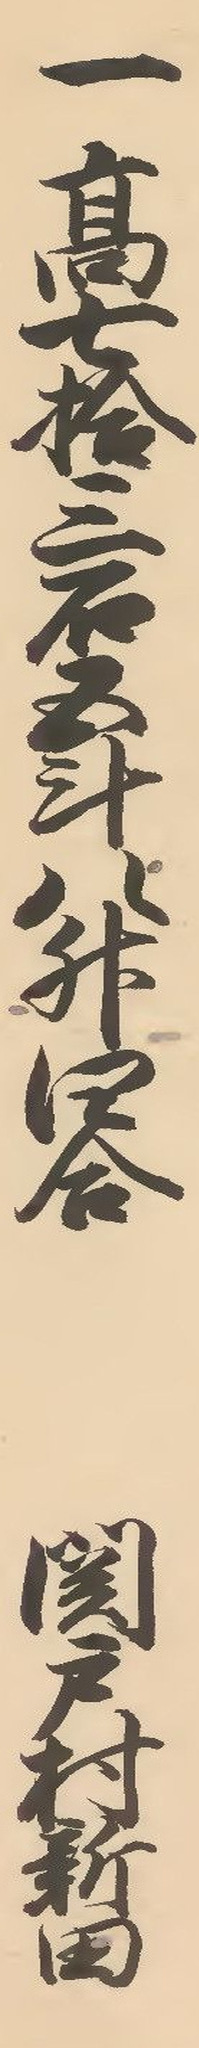一高七拾三石五斗八升四合関戸村新田

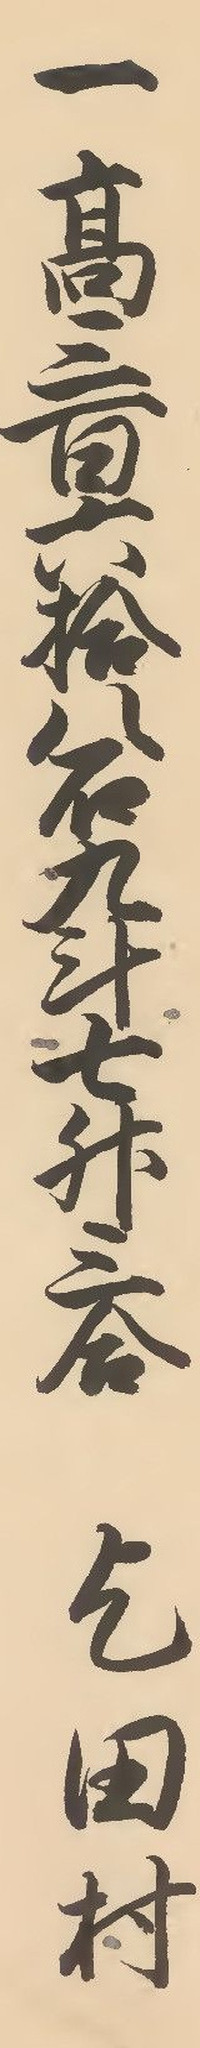一高三百六拾八石九斗七升三合乞田村
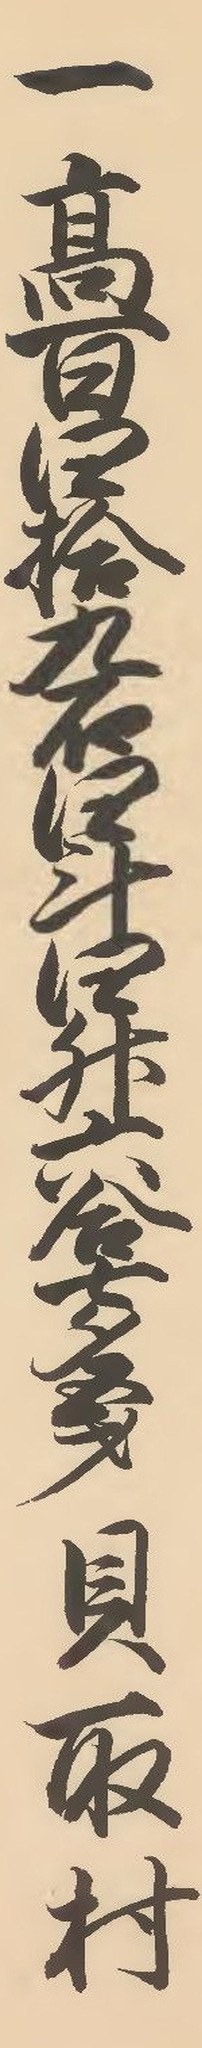一高百四拾九石四斗四升六合七勺五才貝取村
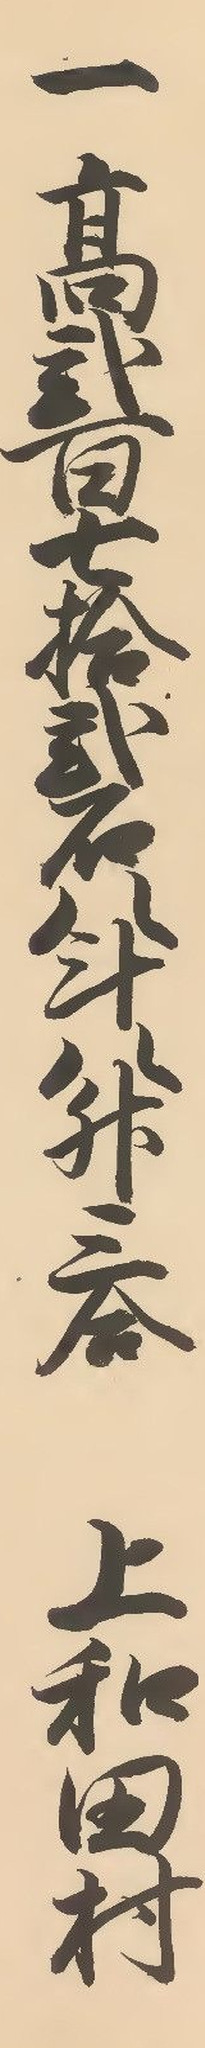一高弐百七拾弐石八斗八升三合上和田村
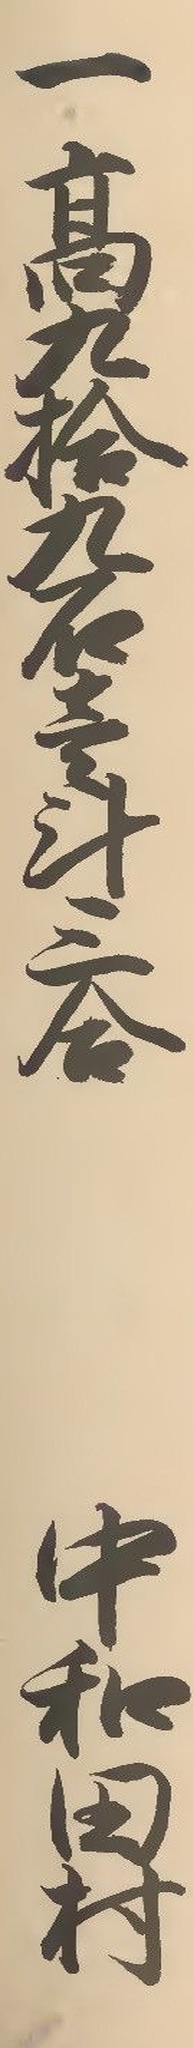一高九拾九石壱斗三合中和田村
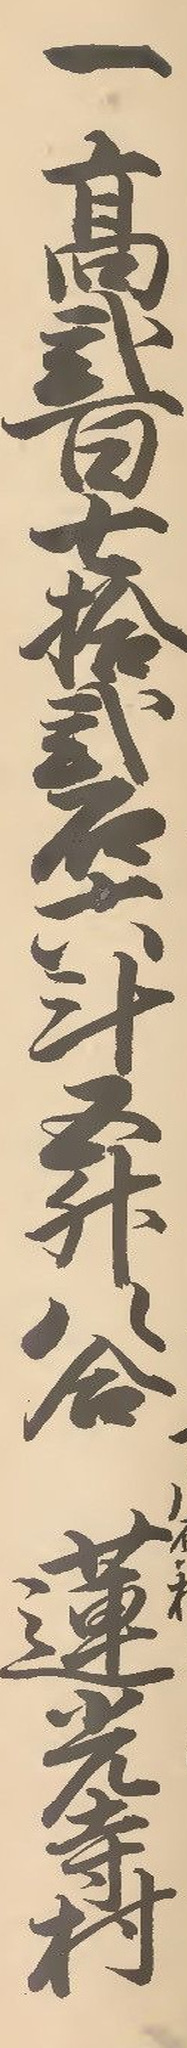一高弐百七拾弐石六斗五升八合蓮光寺村
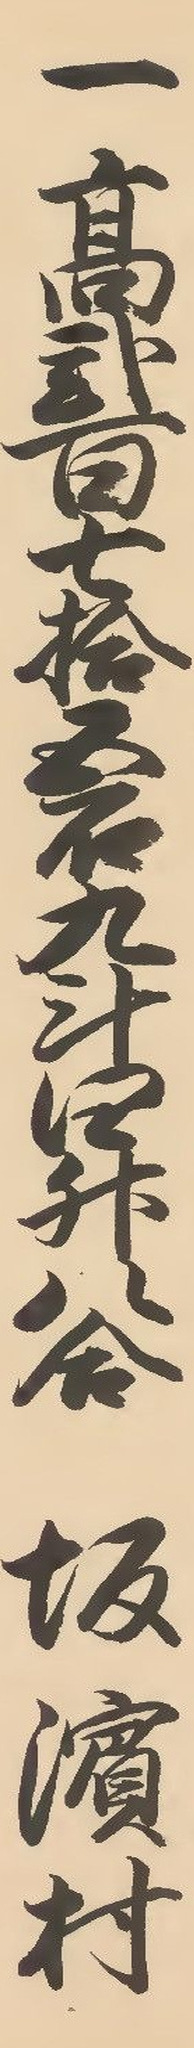一高弐百七拾五石九斗四升八合坂濱村
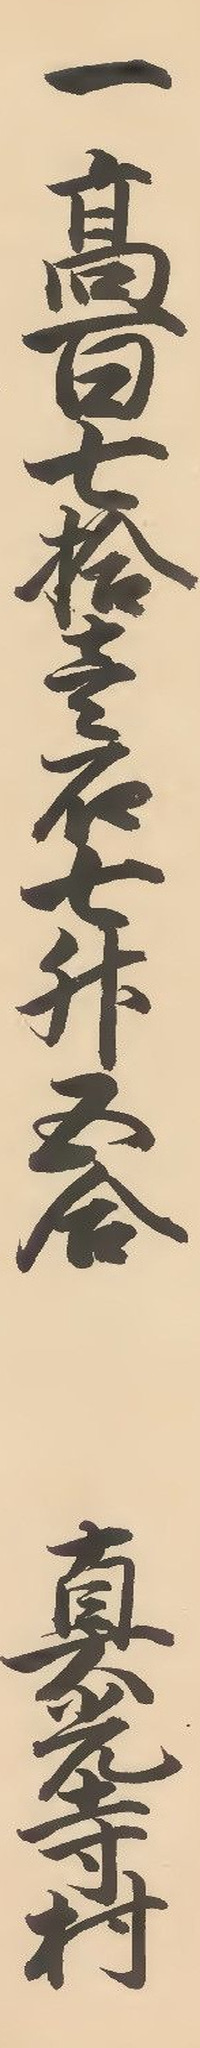一高百七拾壱石七升五合真光寺村
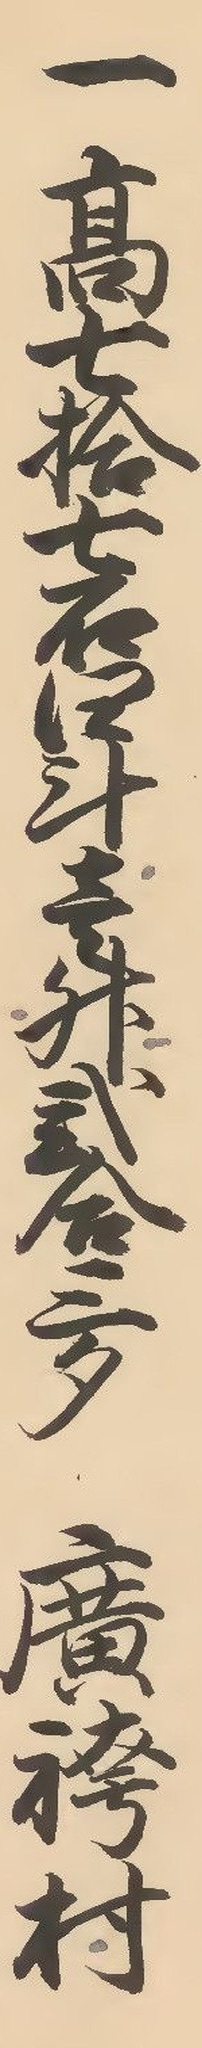一高七拾七石四斗壱升弐合三勺広袴村

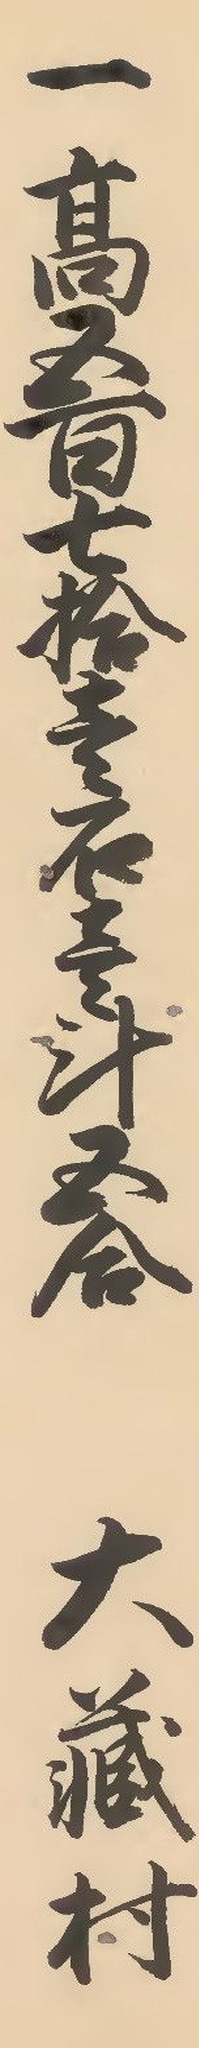一高五百七拾壱石壱斗五合大蔵村
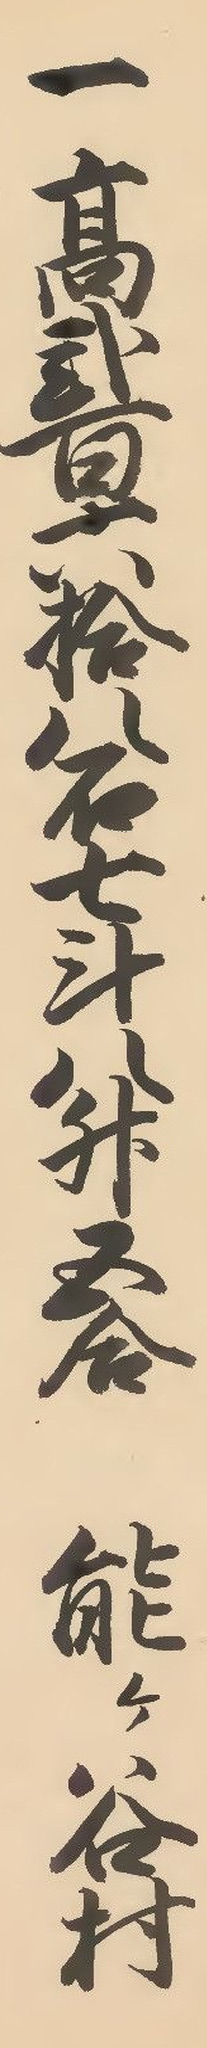一高弐百六拾八石七斗八升五合能ヶ谷村
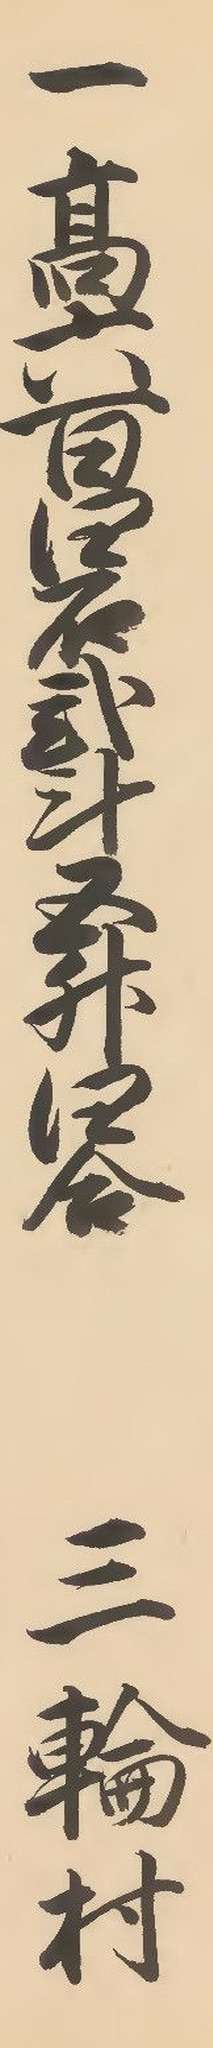一高六百四石弐斗五升四合三輪村
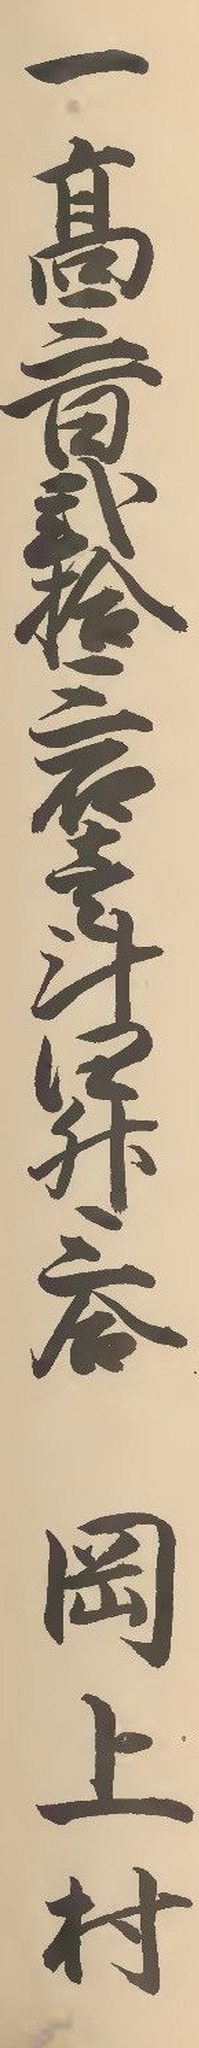一高三百弐拾三石壱斗四升三合岡上村
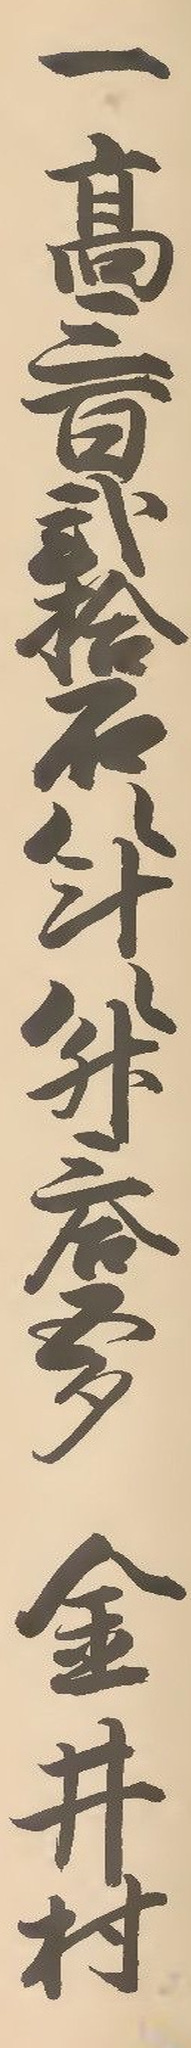一高三百弐拾石八斗八升三合五勺金井村
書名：武蔵国郷帳　上
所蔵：国立公文書館 National Archives of Japan
